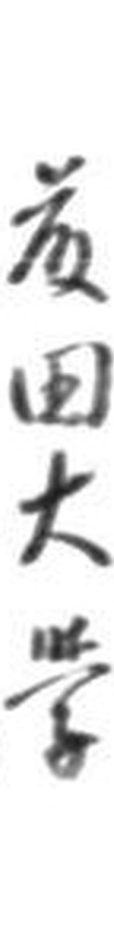藤田大学
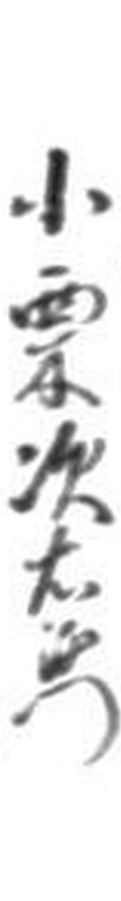小栗次右衛門
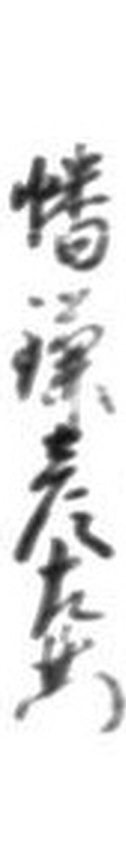幡鎌彦左衛門
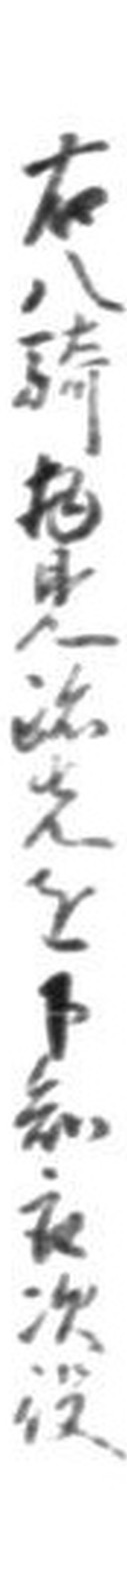右八騎物見跡先を下知取次役
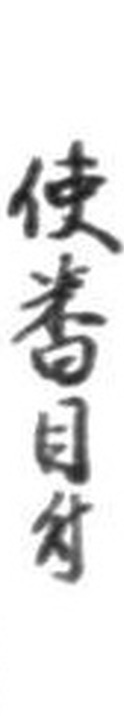使番目付
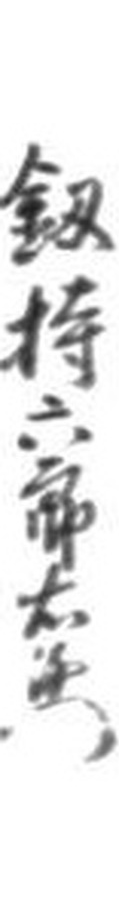剣持六郎右衛門
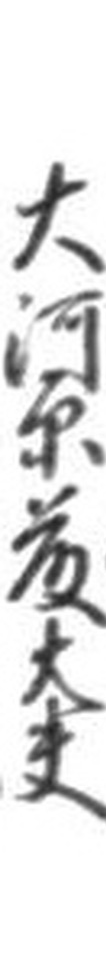大河原藤大夫
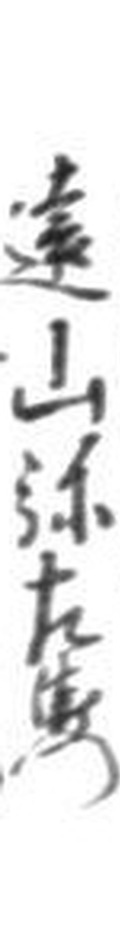遠山弥左衛門
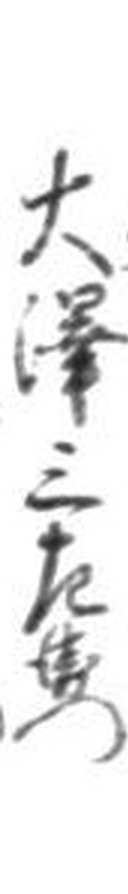大沢三左衛門
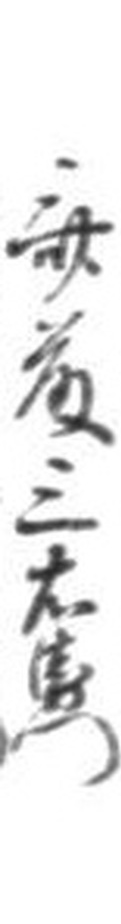斎藤三右衛門
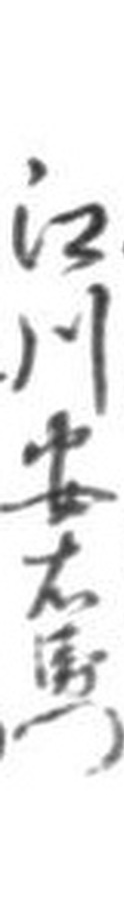江川安右衛門
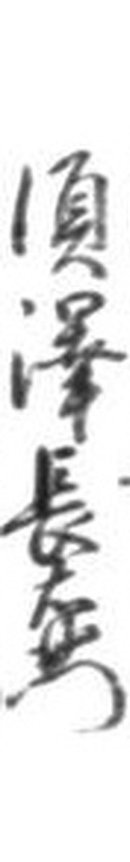須沢長右衛門
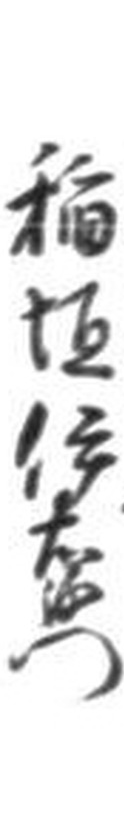稲垣伊右衛門

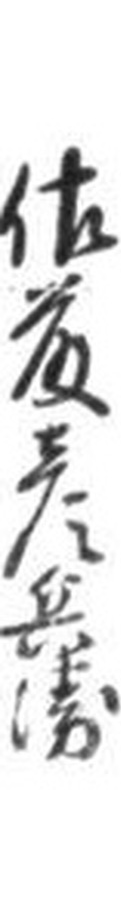佐藤彦兵衛
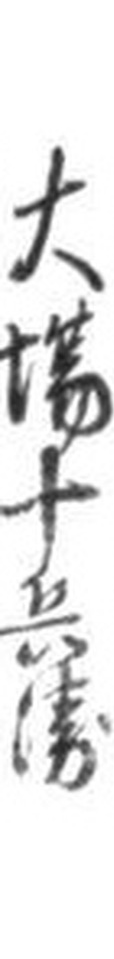大場十兵衛
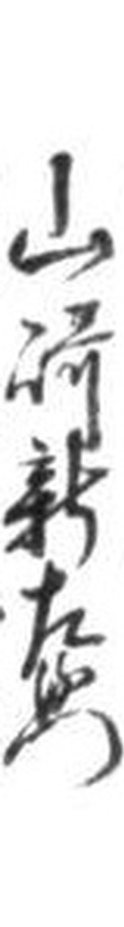山崎新左衛門
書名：家譜 二 忠直公 従文禄四年到慶安四年
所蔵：福井県文書館 Fukui Prefectural Archives
